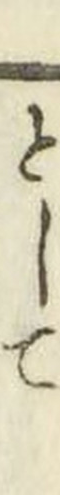として
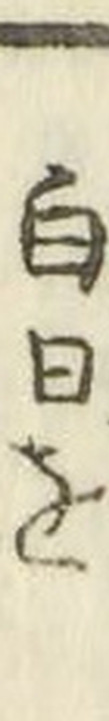白日を
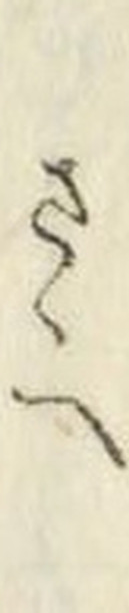さゝへ
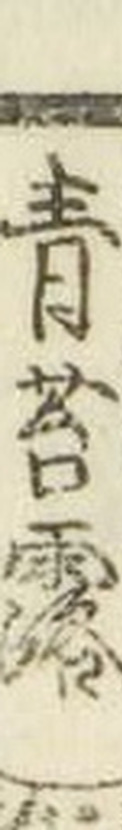青苔露
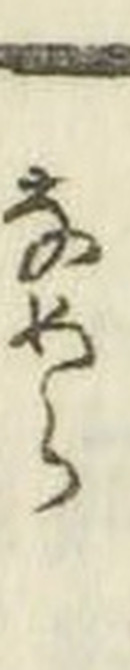なめら
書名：江戸名所図会 20巻 巻之15
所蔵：東京学芸大学教育コンテンツアーカイブ
